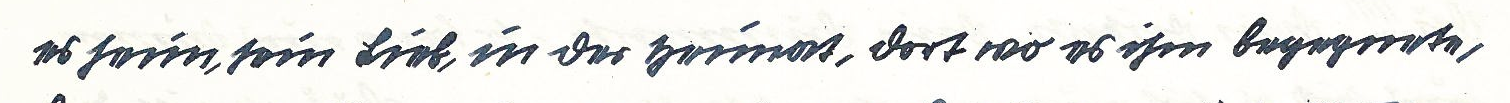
es heim, sein Lieb, in der Heimat, dort wo es ihm begegnete,
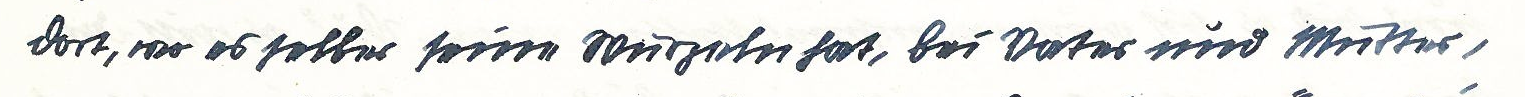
dort, wo es selber seine Wurzeln hat, bei Vater und Mutter,
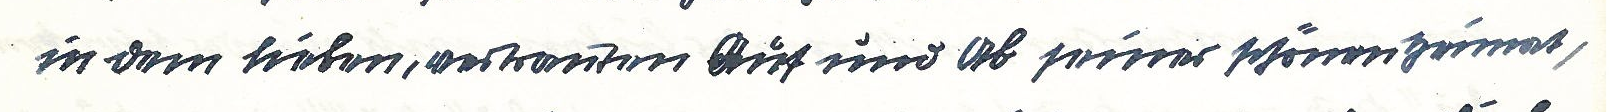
in dem lieben, vertrauten Auf und Ab seiner schönen Heimat,
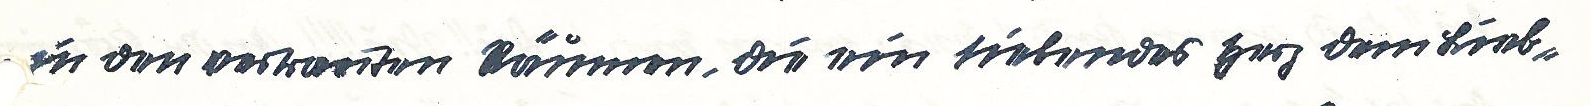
in den vertrauten Räumen, die ein liebendes Herz dem Lieb¬
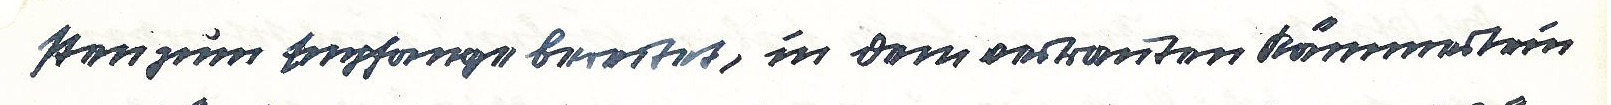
sten zum Empfange bereitet, in dem vertrauten Kämmerlein
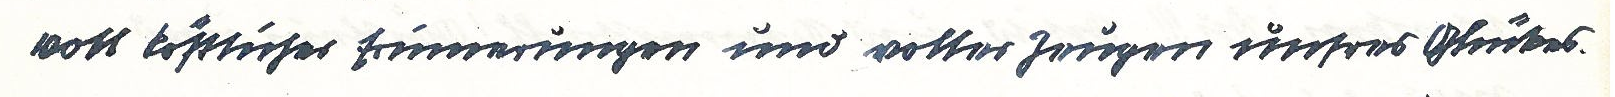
voll köstlicher Erinnerungen und voller Zeugen unseres Glückes.
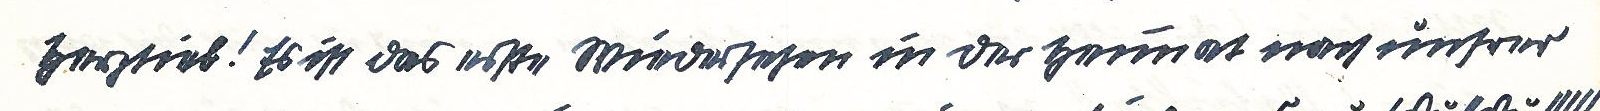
Herzlieb! Es ist das erste Wiedersehen in der Heimat nach unsrer
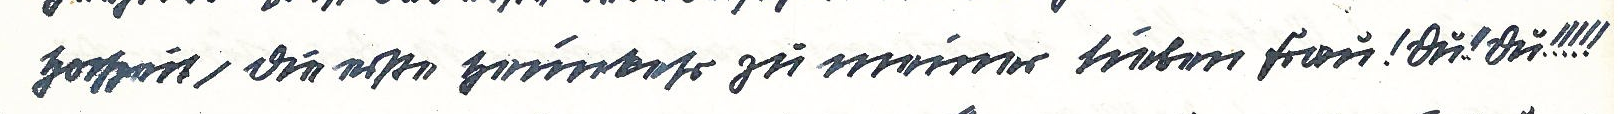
Hochzeit, die erste Heimkehr zu meiner lieben Frau! Du!! Du!!!!!
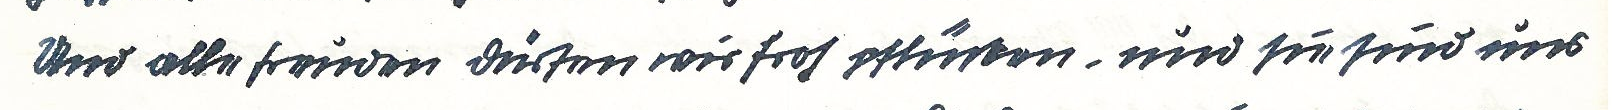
Und alle Freuden dürfen wir froh pflücken, und sie sind uns
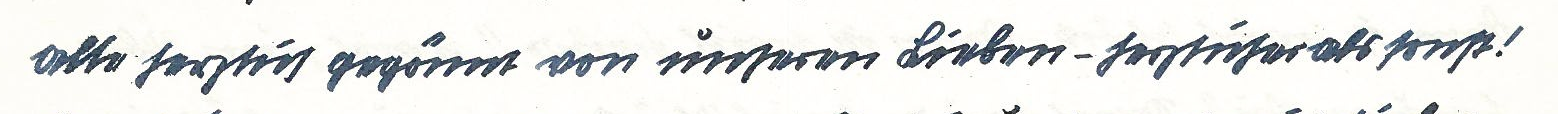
alle herzlich gegönnt von unseren Lieben, herzlicher als sonst!
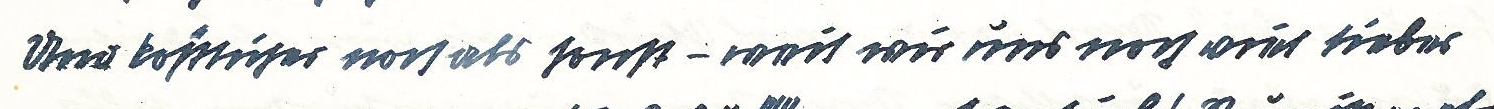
Und köstlicher noch als sonst – weil wir uns noch viel lieber
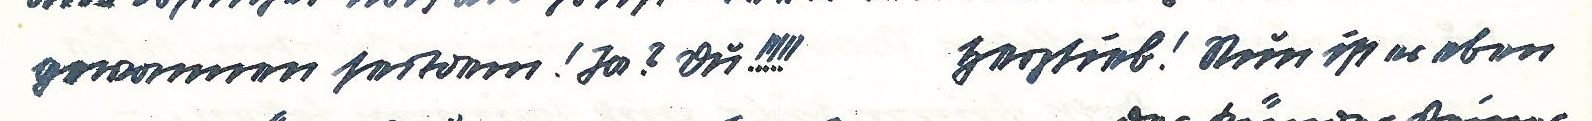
gewonnen seitdem! Ja? Du!!!!! Herzlieb! Nun ist er eben
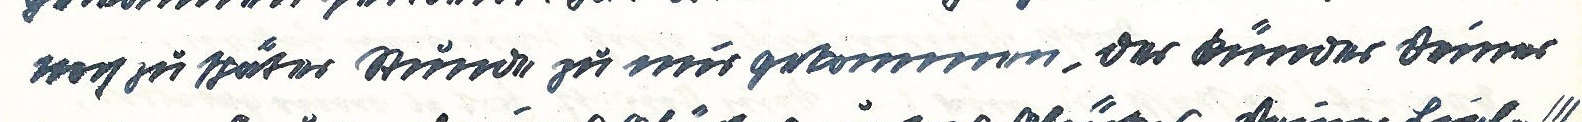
noch zu später Stunde zu mir gekommen, der Künder Deiner
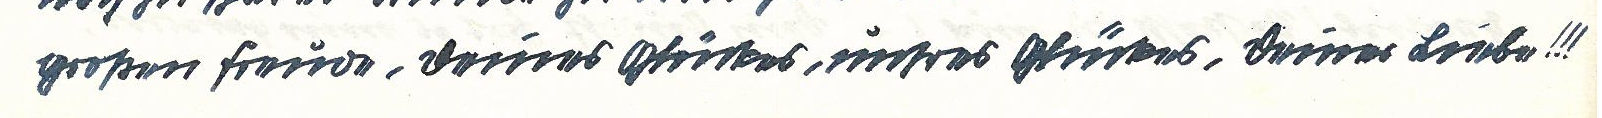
großen Freude, Deines Glückes, unsres Glückes, Deiner Liebe!!!
